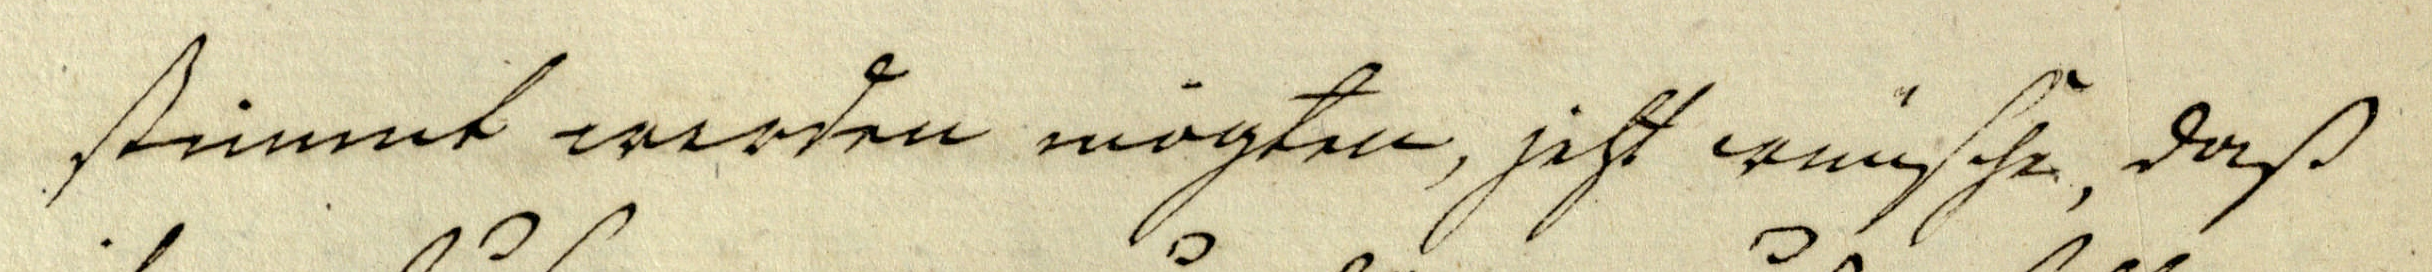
stimmt werden mögten, jetzt wünsche, daß
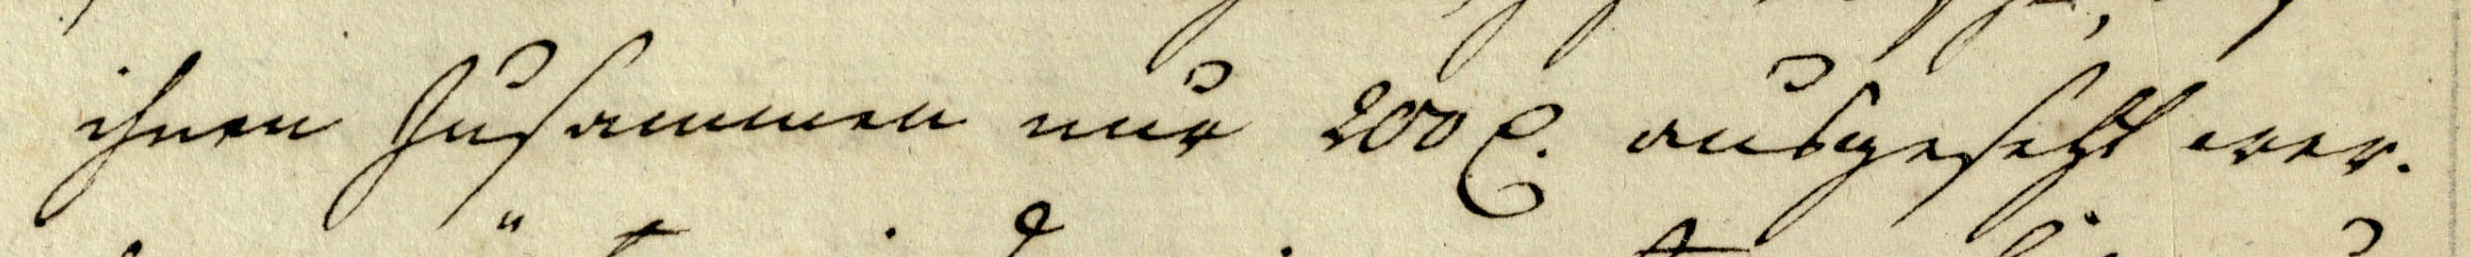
ihnen zusammen nur 200 c. ausgesetzt wer¬
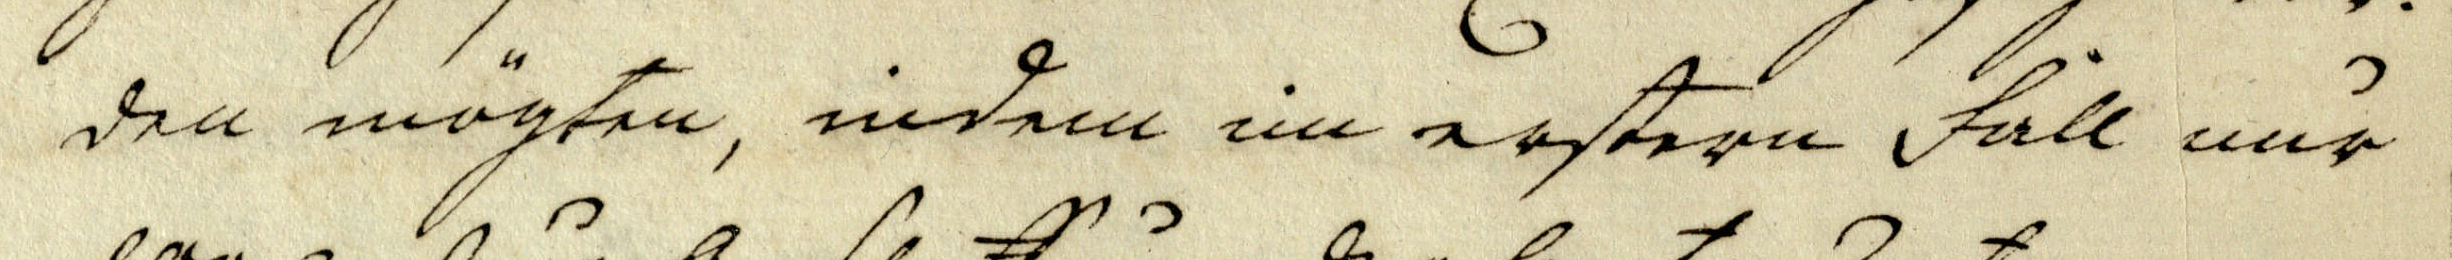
den mögten, indem im erstern Fall nur
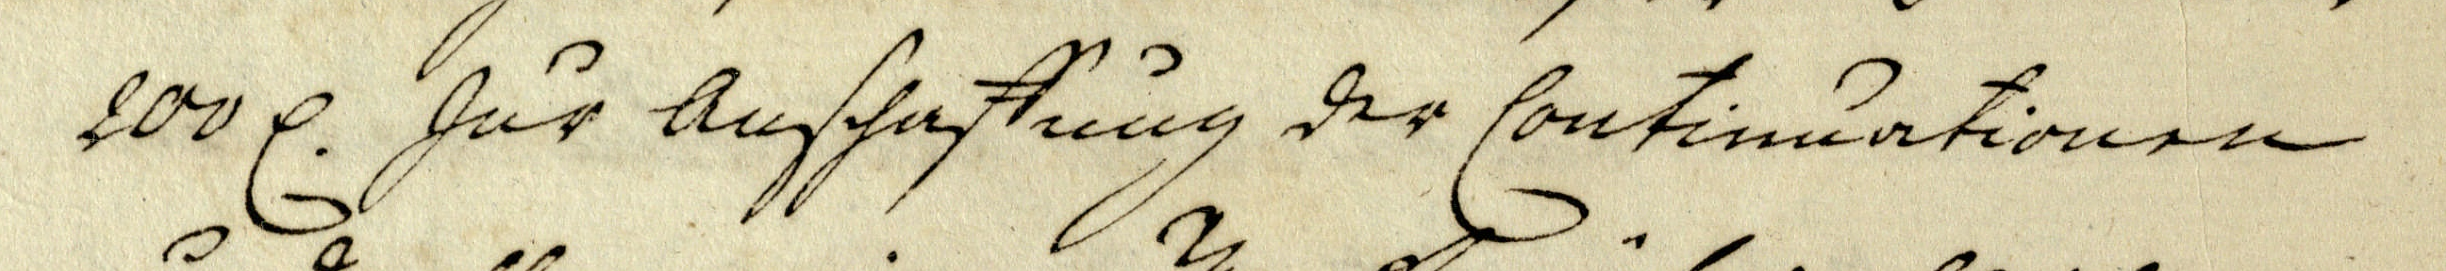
200 l. zur Anschaffung der Continuationen
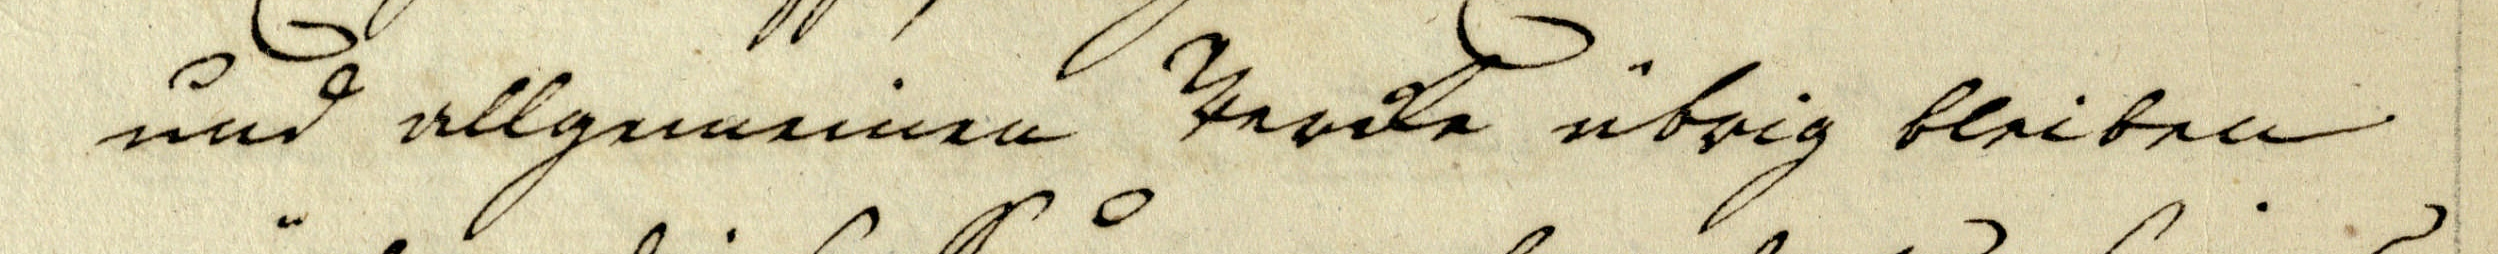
und allgemeinen Wercke übrig bleiben
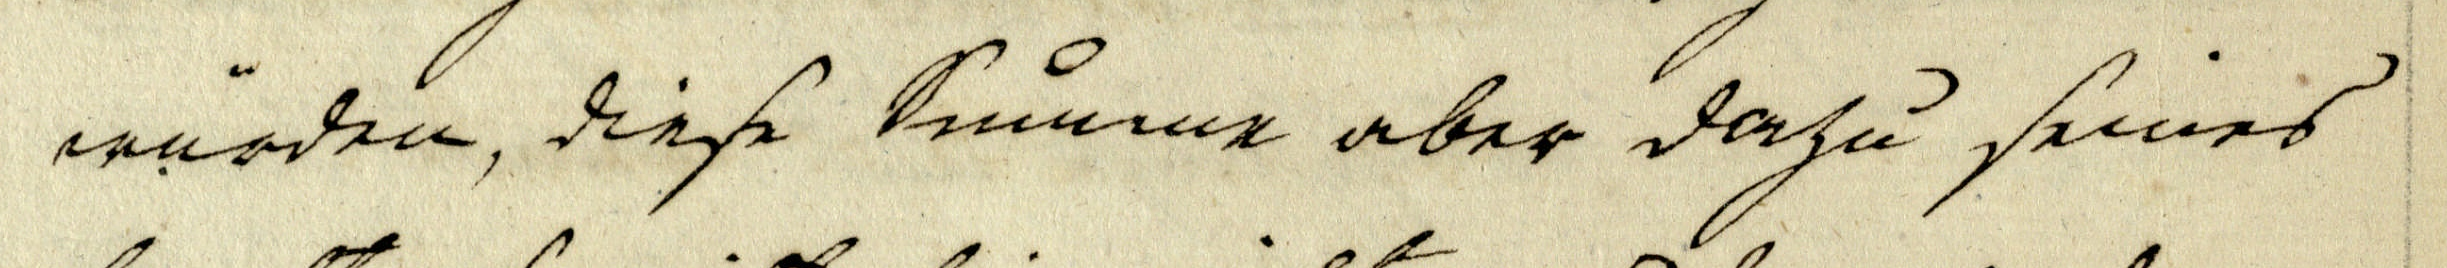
würden, diese Summe aber dazu seines
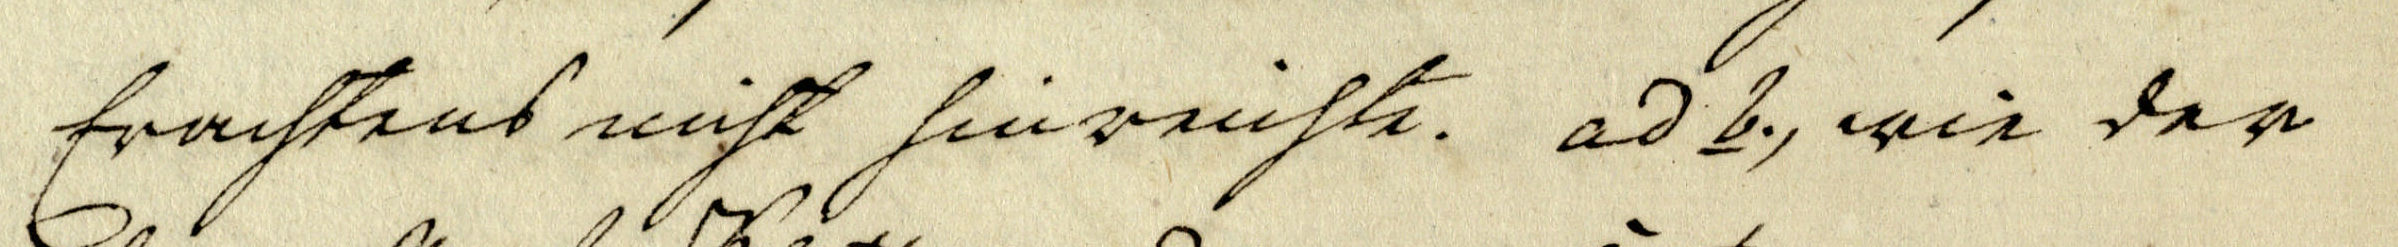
Erachtens nicht hinreichte. ad b., wie der
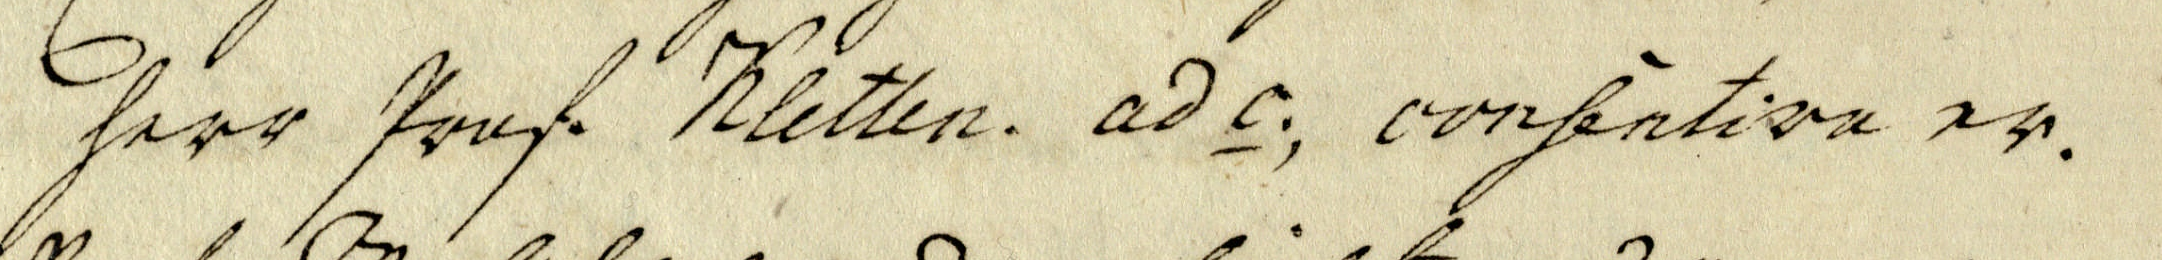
Herr Prof. Kletten. ad c., consentire er.
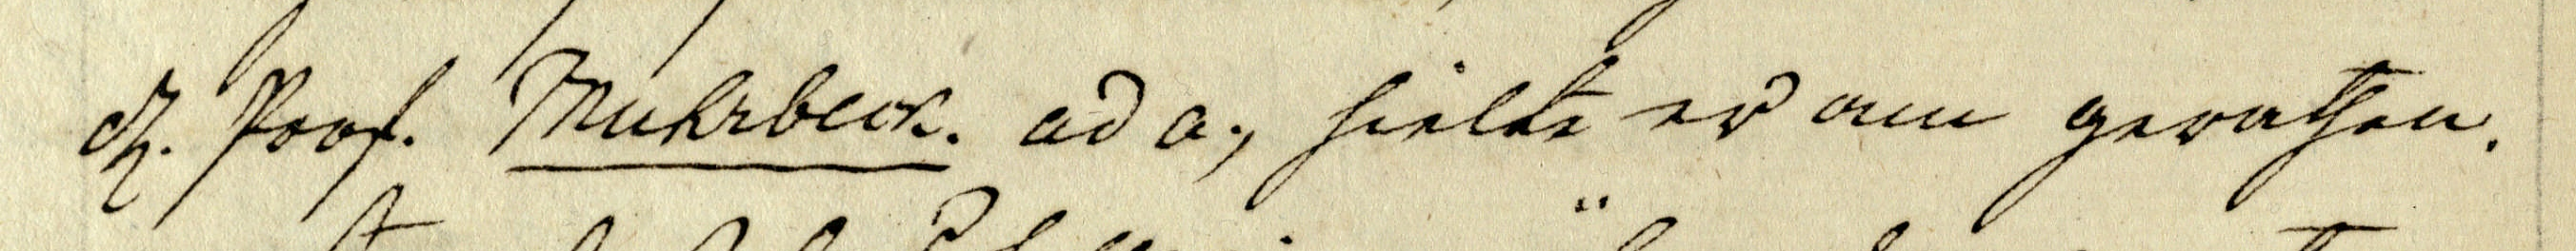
dh. Prof. Muhrbeck. ad a, hielte er am gerathen¬
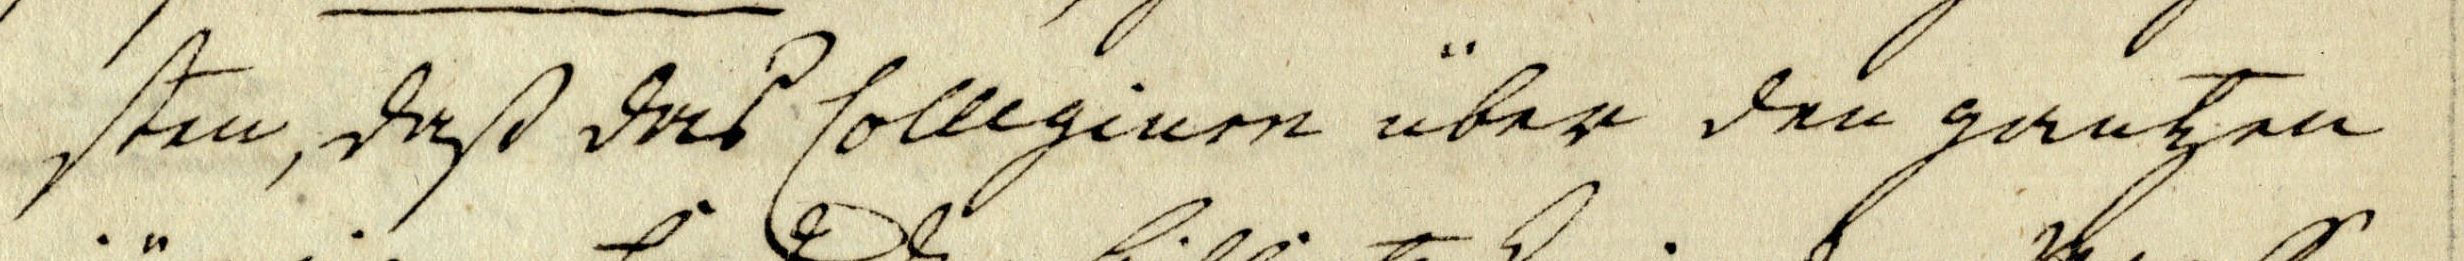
sten, daß das Collegium über den gantzen
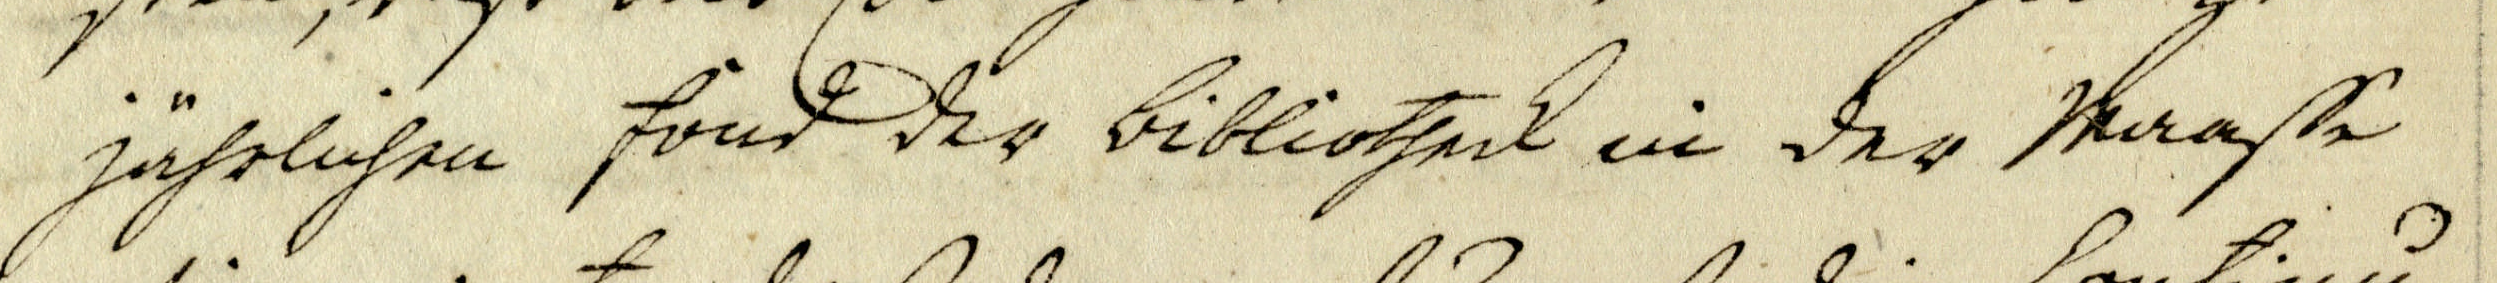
jährlichen Fond der Bibliotheck in der Maasse
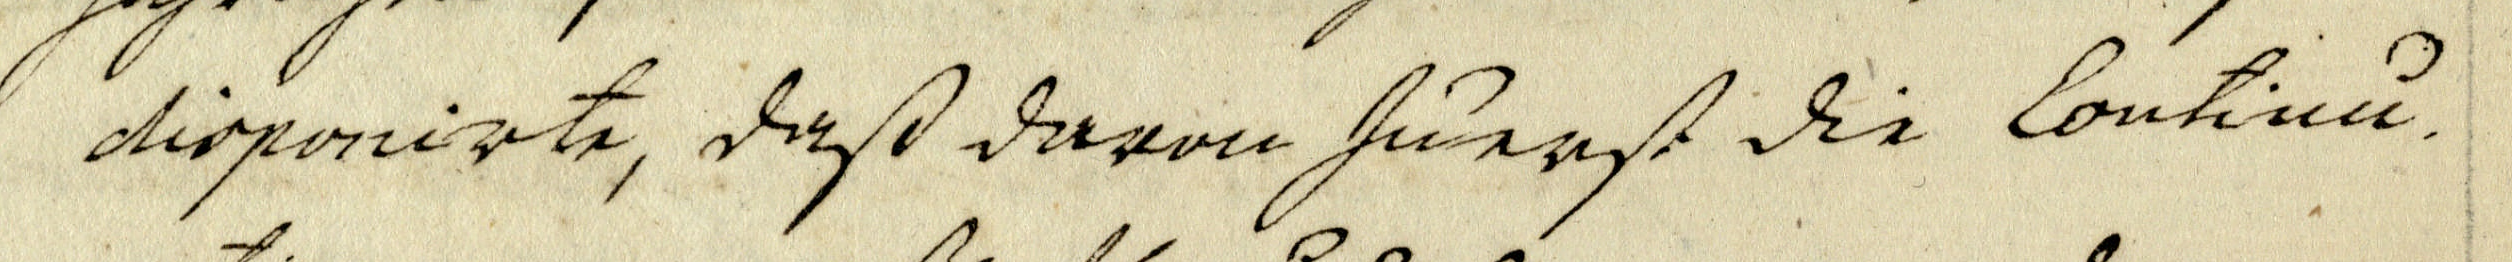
disponirte, daß davon zuerst die Continu¬
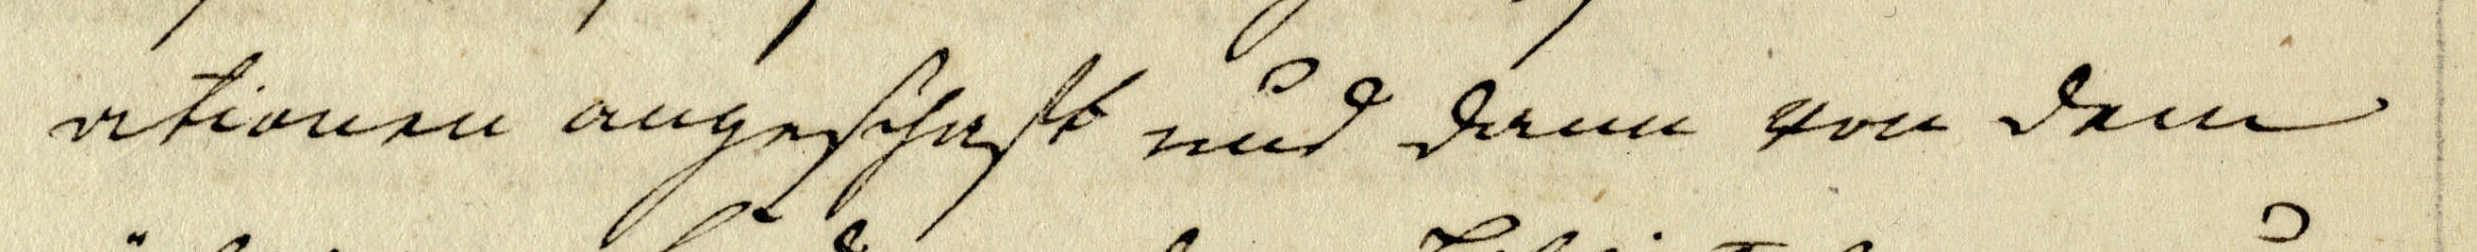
ationen angeschaft und dann von dem
